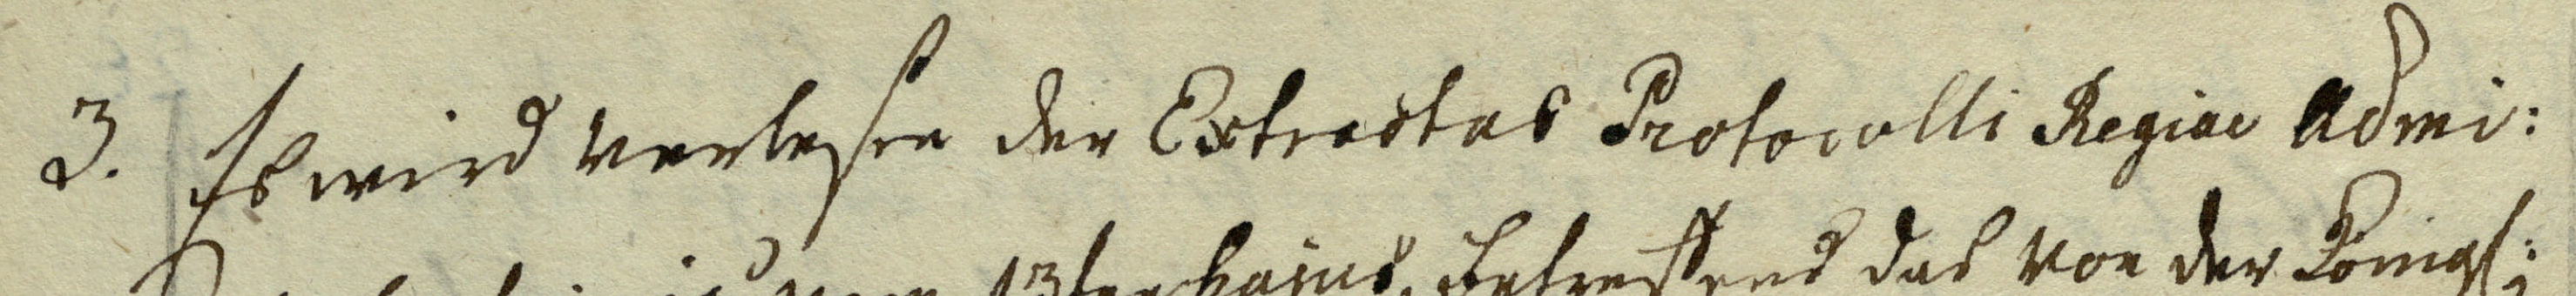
3. Es wird verlesen der Extractus Protocolli Regiae Admi¬
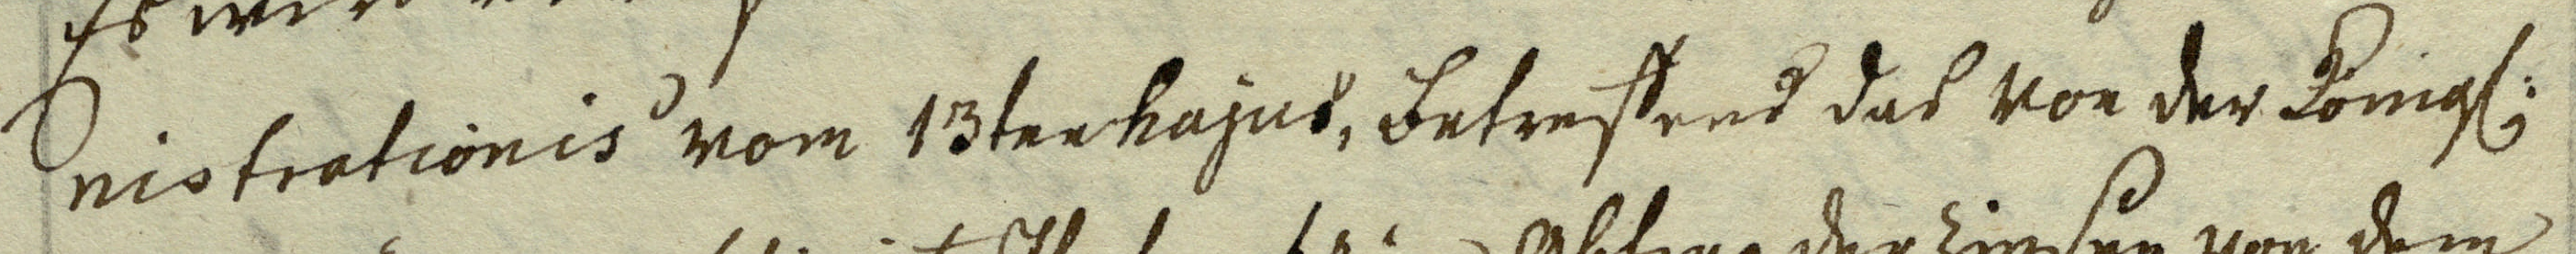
nistrationis vom 13. hujus, betreffend das von der Königl.
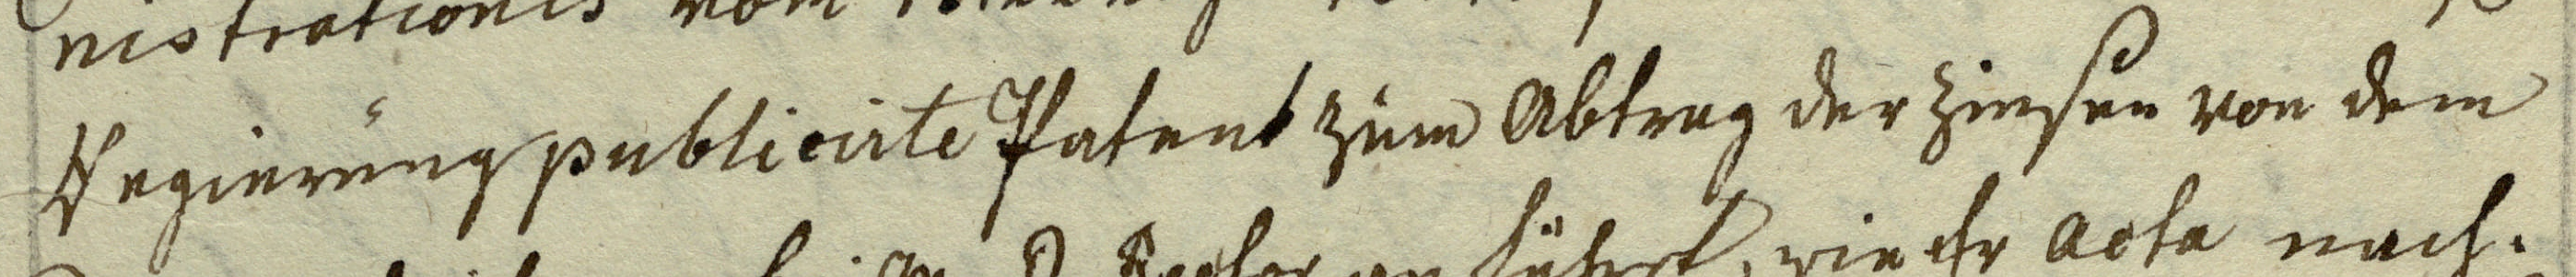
Regierung publicirte Patent zum Abtrag der Zinsen von dem
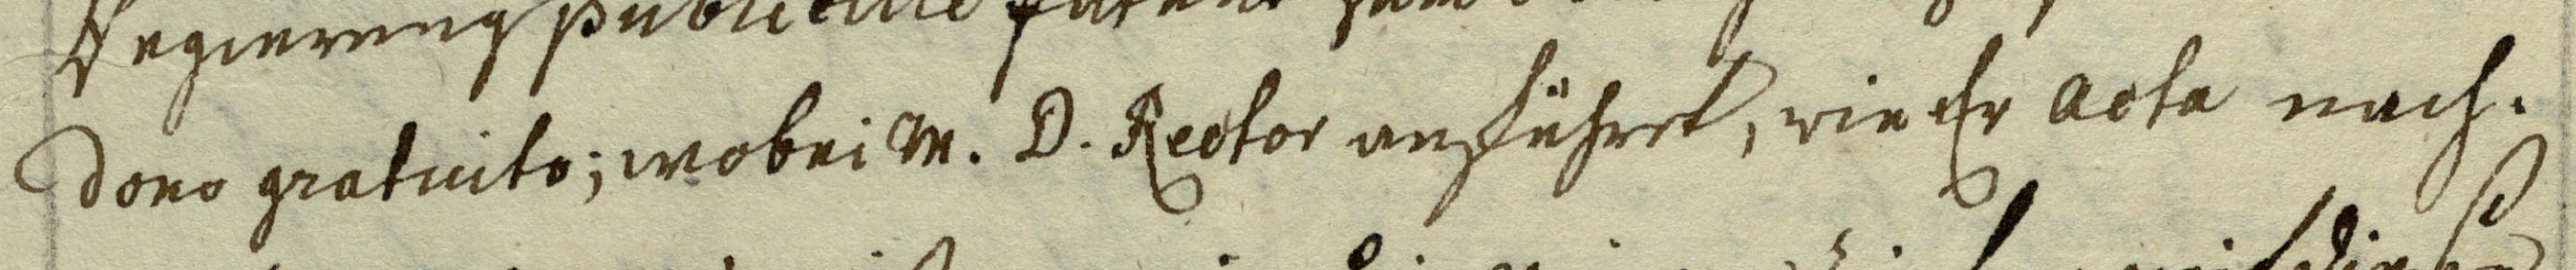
dono gratuito; wobei M. D. Rector anführet, wie Er Acta nach¬
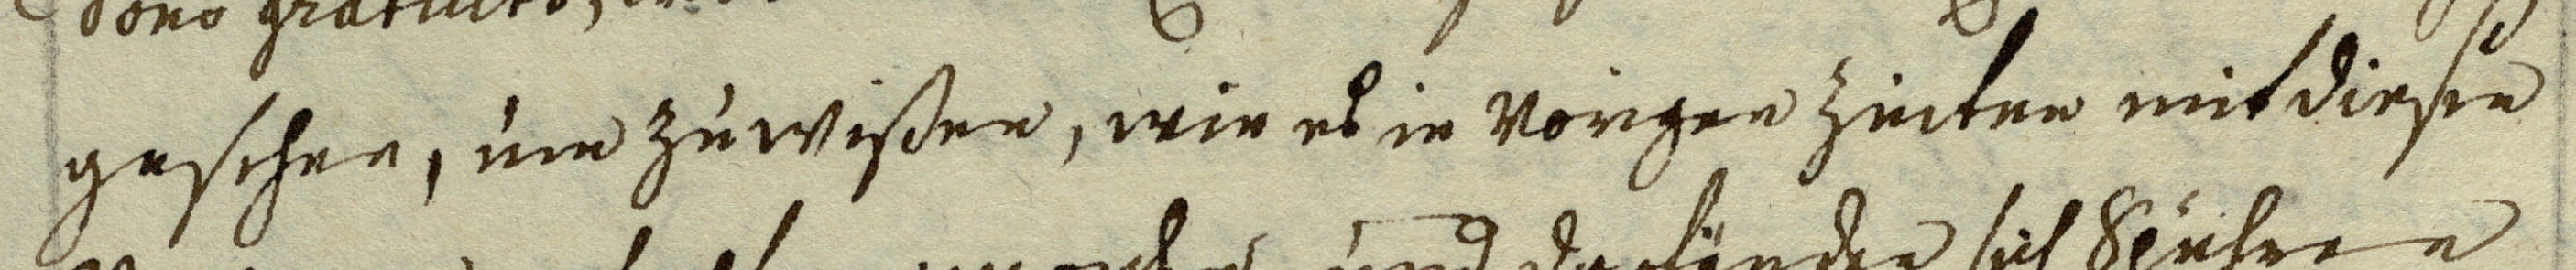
gesehen, um zu wissen, wie es in vorigen Zeiten mit diesen
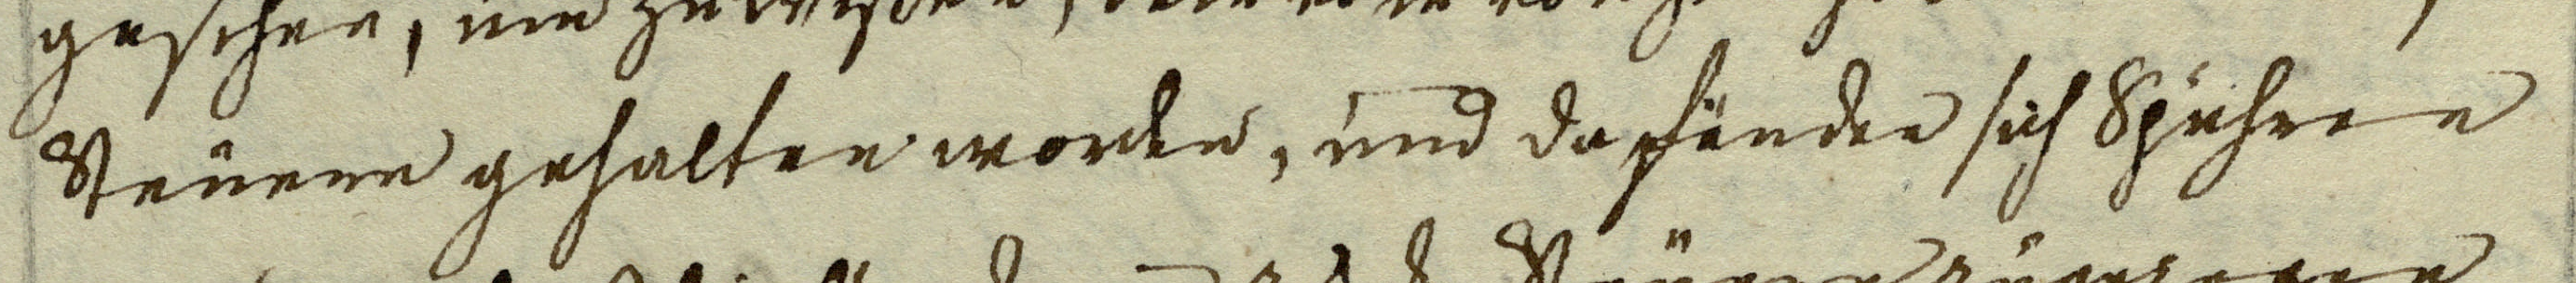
Steuern gehalten worden, und da fänden sich Spuhren
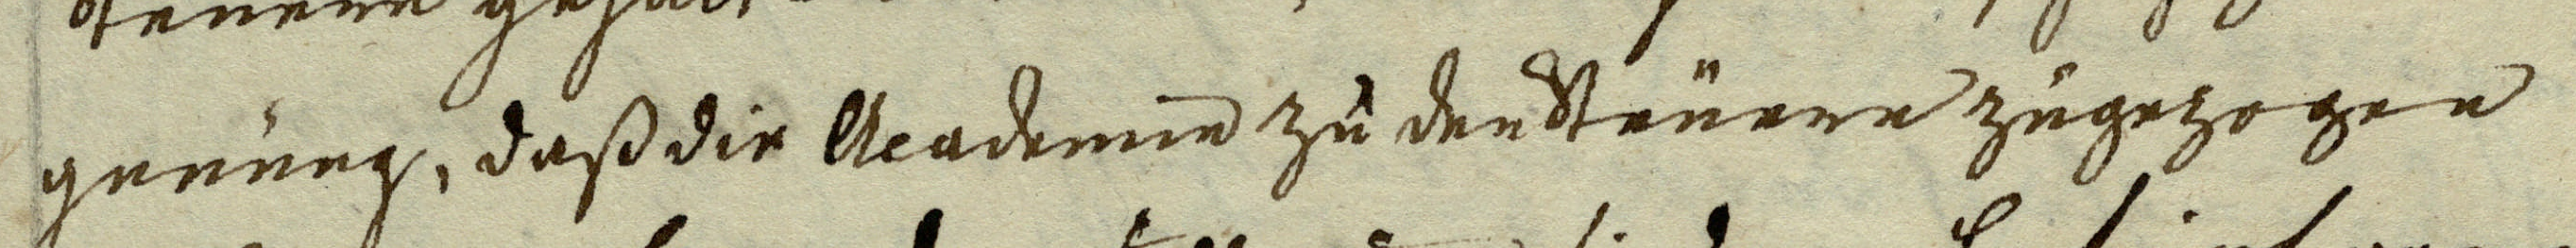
genueg, daß die Academie zu den Steuern zugezogen
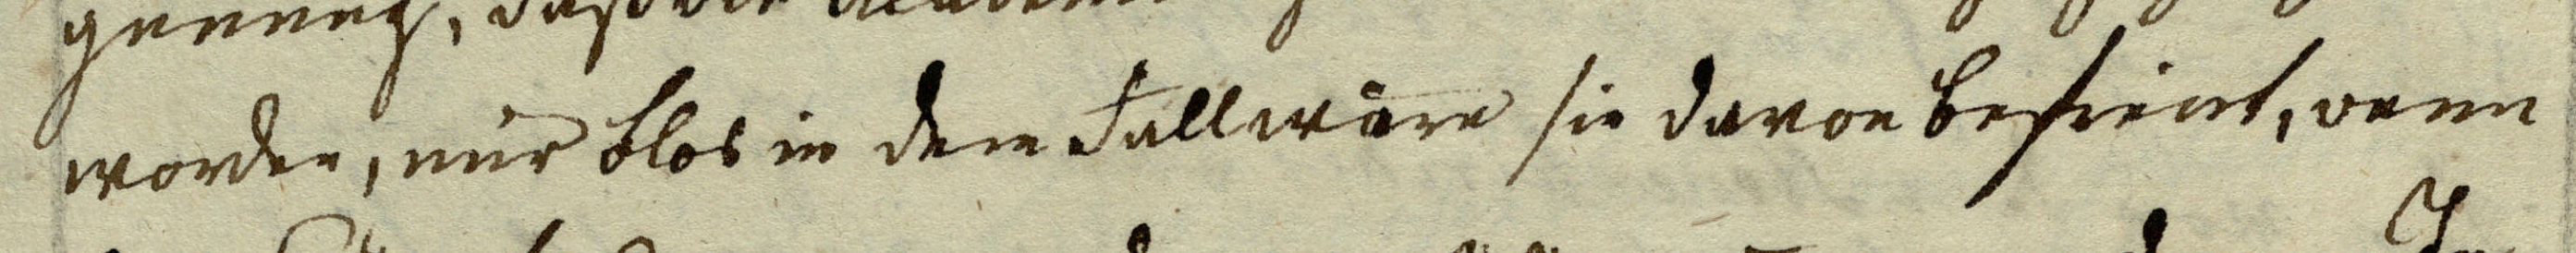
worden, nur blos in dem Fall wäre sie davon befreiet, wenn
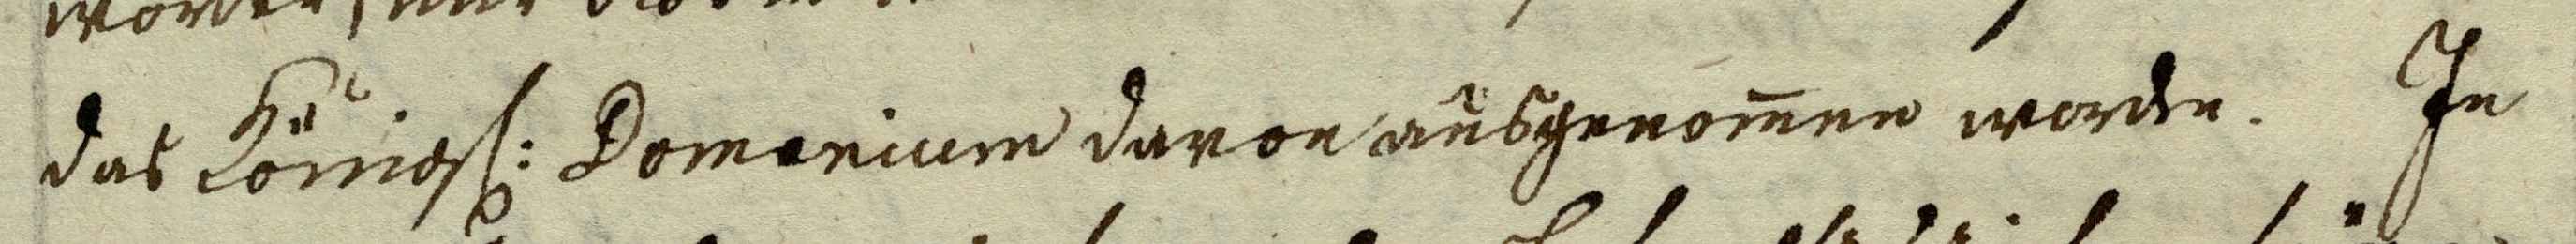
das Königl. Domanium davon ausgenomen worden. In
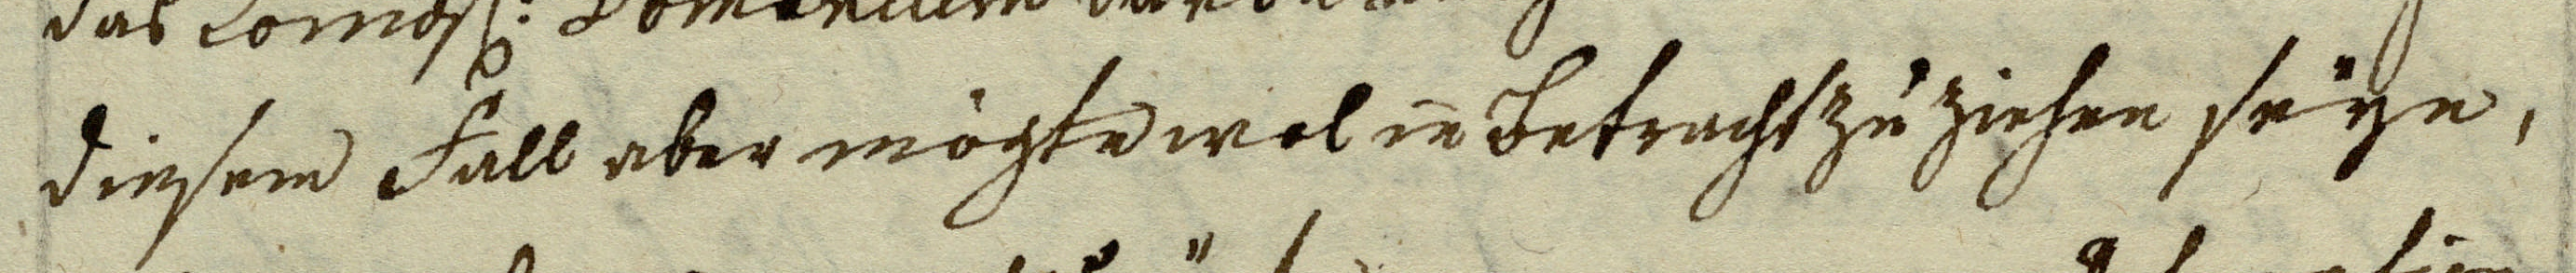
diesem Fall aber mögte wol in Betracht zu ziehen seÿn,
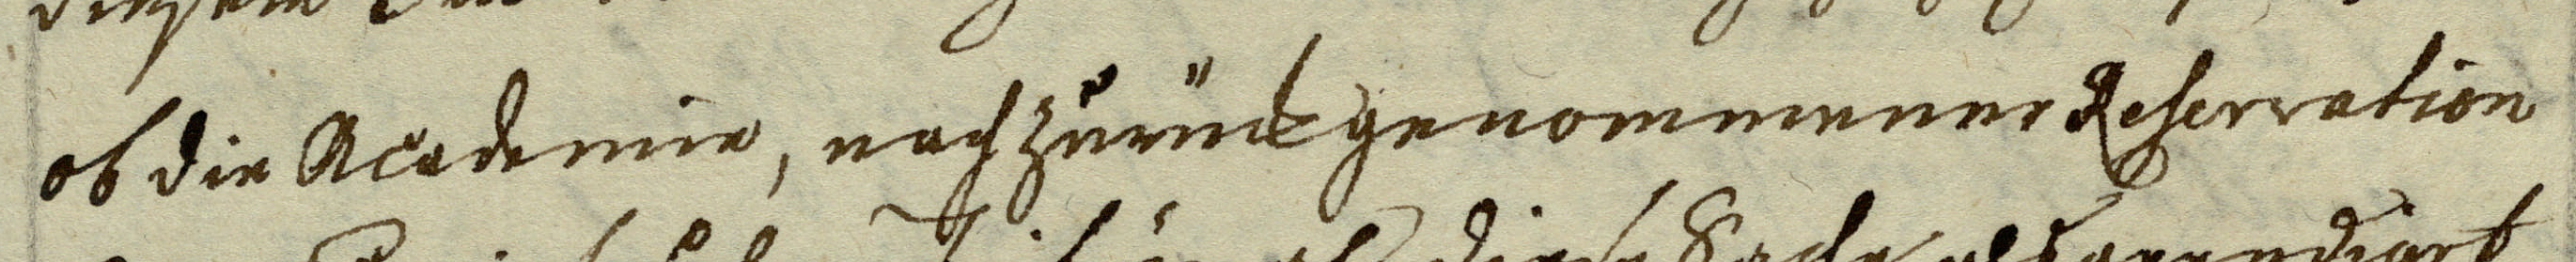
ob die Academie nach zurück genommener Reservation
